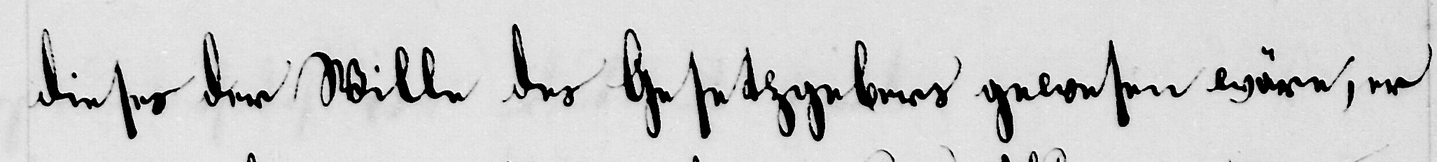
dieses der Wille des Gesetzgebers gewesen wäre, er
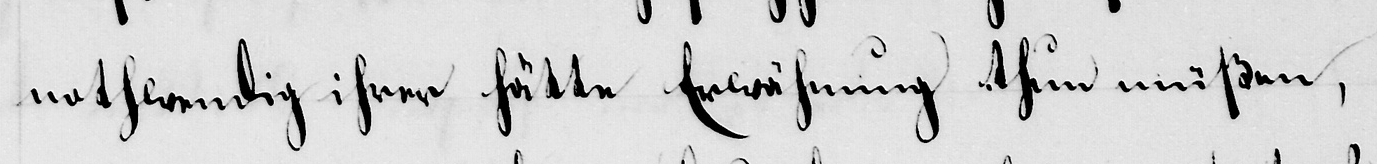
nothwendig ihrer hätte Erwähnung thun müßen,
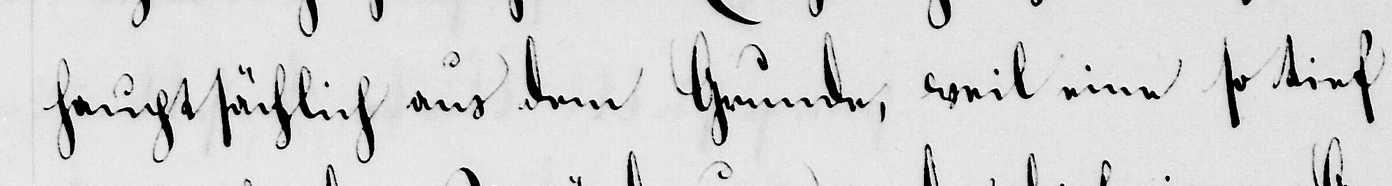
hauptsächlich aus dem Grunde, weil eine so tief
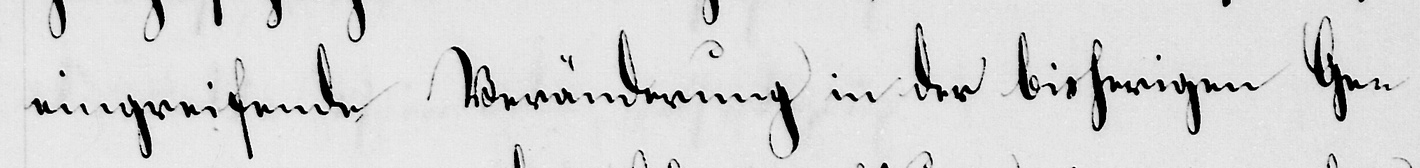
eingreifende Veränderung in der bisherigen Ge¬
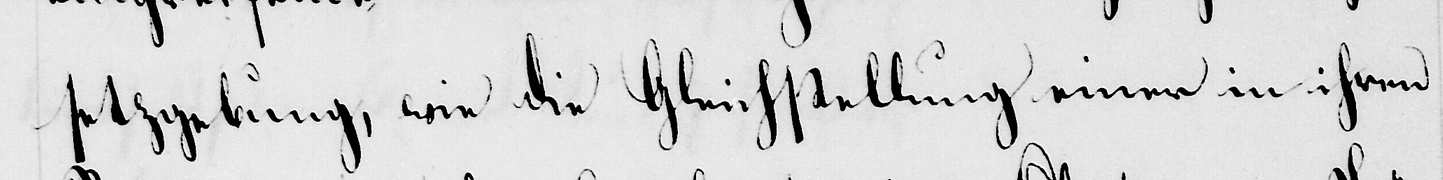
setzgebung, wie die Gleichstellung einer in ihren
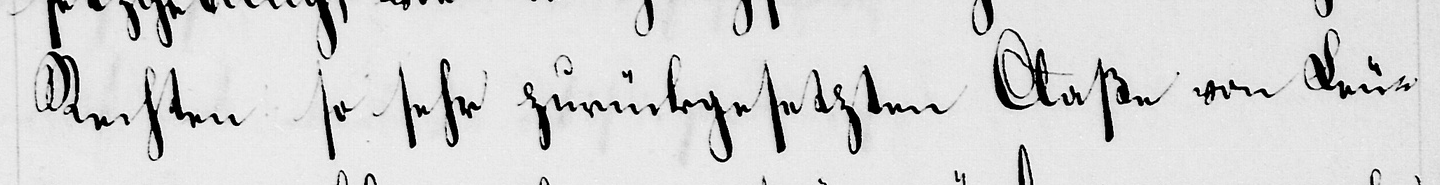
Rechten so sehr zurückgesetzten Claße von Leu¬
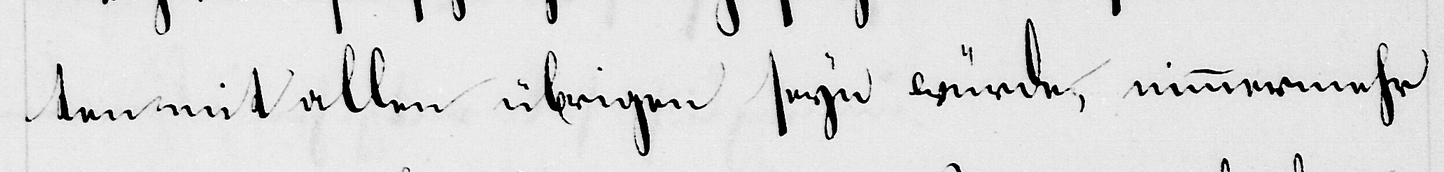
ten mit allen übrigen seyn würde, nimmermehr
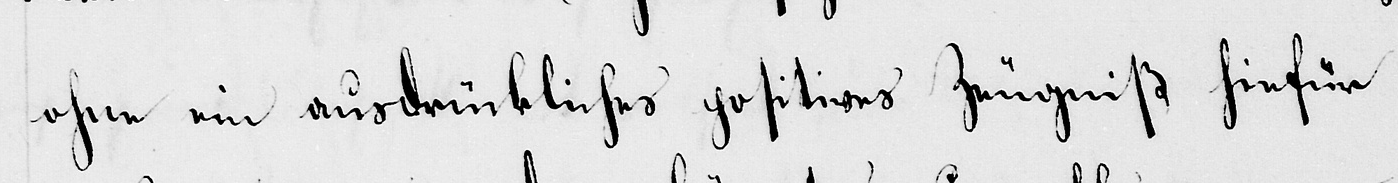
ohne ein ausdrückliches positives Zeugniß hiefür
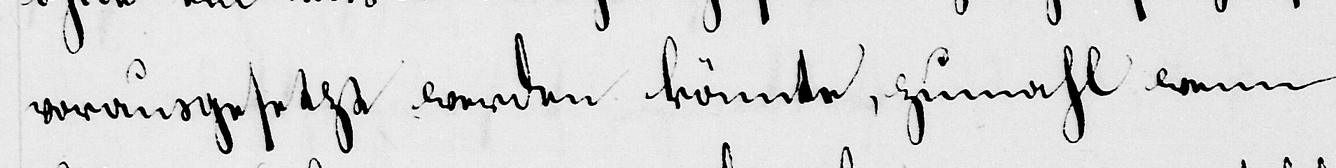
vorausgesetzt werden könnte, zumahl wenn
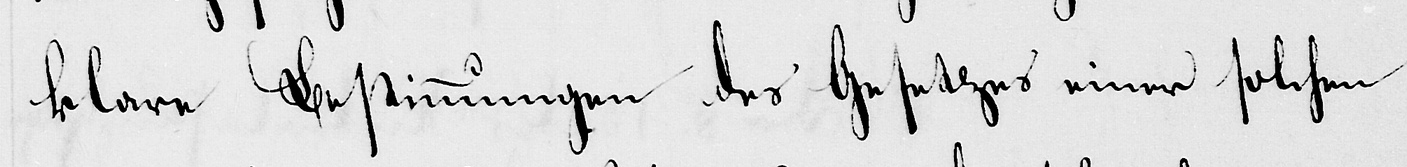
klare Bestimmungen des Gesetzes einer solchen
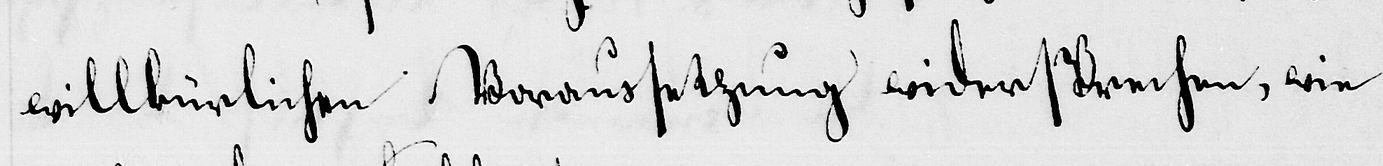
willkürlichen Voraussetzung widersprechen, wie
